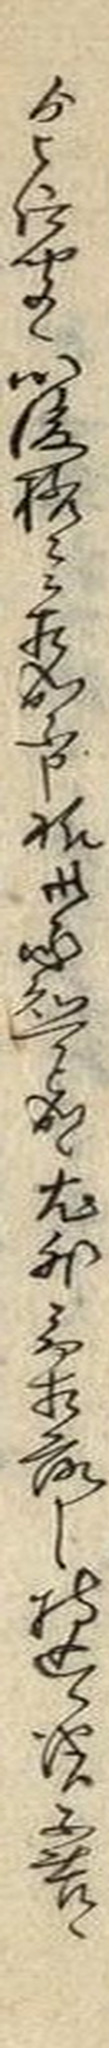ゟ仰聞候以後格々に相成不申候様御承知可被成候尤外に而相落し持込候儀は不苦候

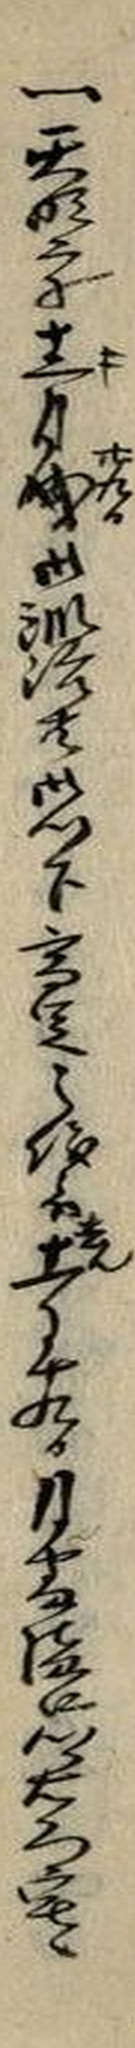一天明二寅十二月廿九日御鍛冶共御門下高足之儀に付去ル十一月十九日月番溝口郷右衛門宅へ
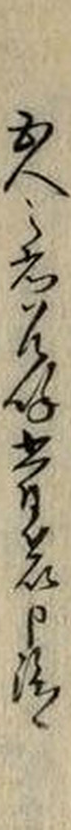五人之者共召呼書付を以申渡候
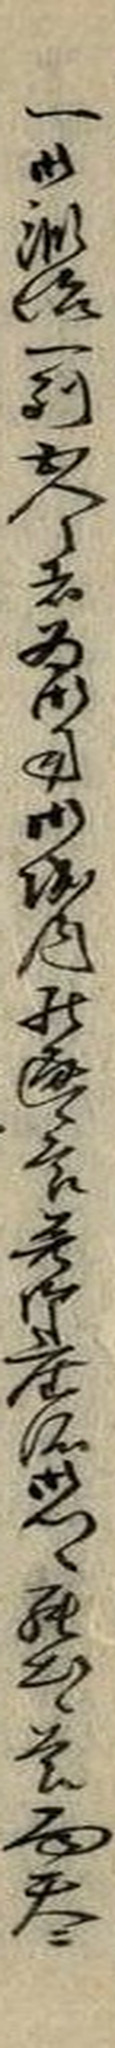一御鍛冶一列五人之者為御用御城内罷通候節并御座所御門へ罷出候節雨天に
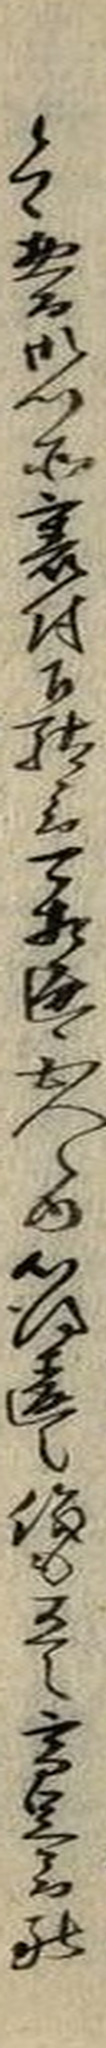候はゝ惣而御門所裏付下駄に而可相通候五人之内心得違之儀も有之高足に而罷
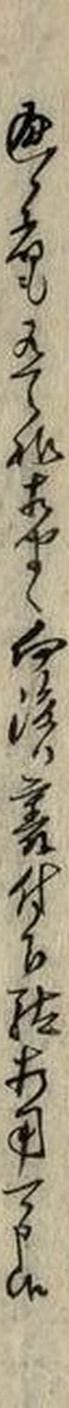通候者も有之候様相聞候向後は裏付下駄相用可申候
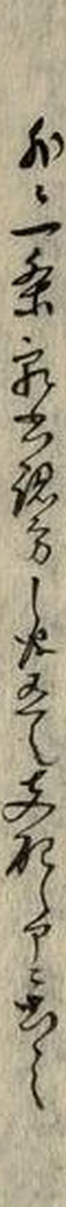外に一条願書認方之儀有之支配之部に出之
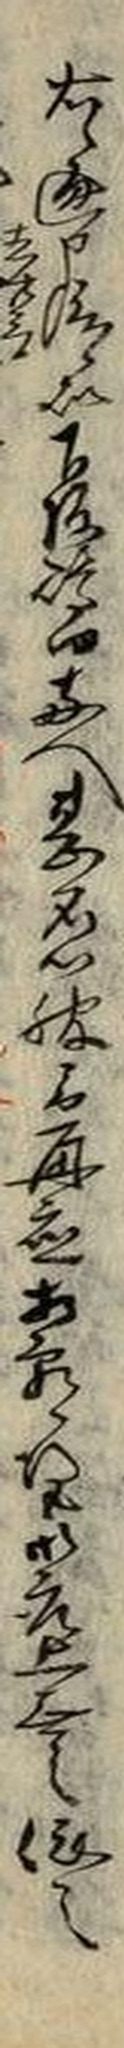右之通申渡候処下坂嶋田両人甚不心服に而再応相願候得共御取上無之依之
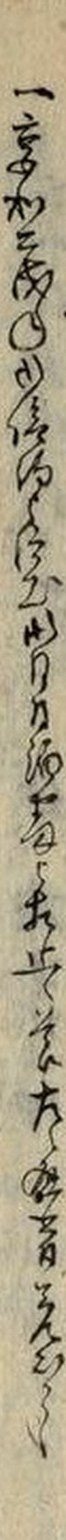一享和二戌年御停泊被仰出御目付泊番被相止候節左之通書付差出之
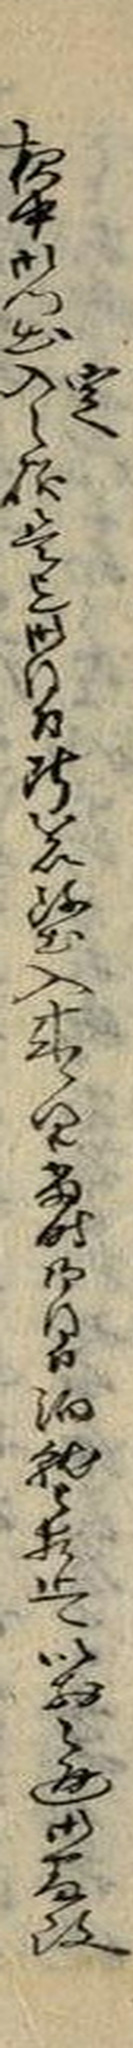夜中御門出入之儀是迄御目付断を以致出入来候得共当時御目付泊就被相止候以前之通御番改
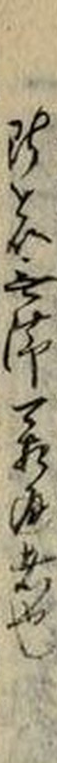断を以無滞可相通者也
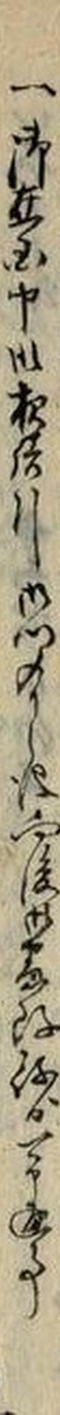一御在国中御夜詰引御門〆り候儀向後御番改役ゟ可申通事
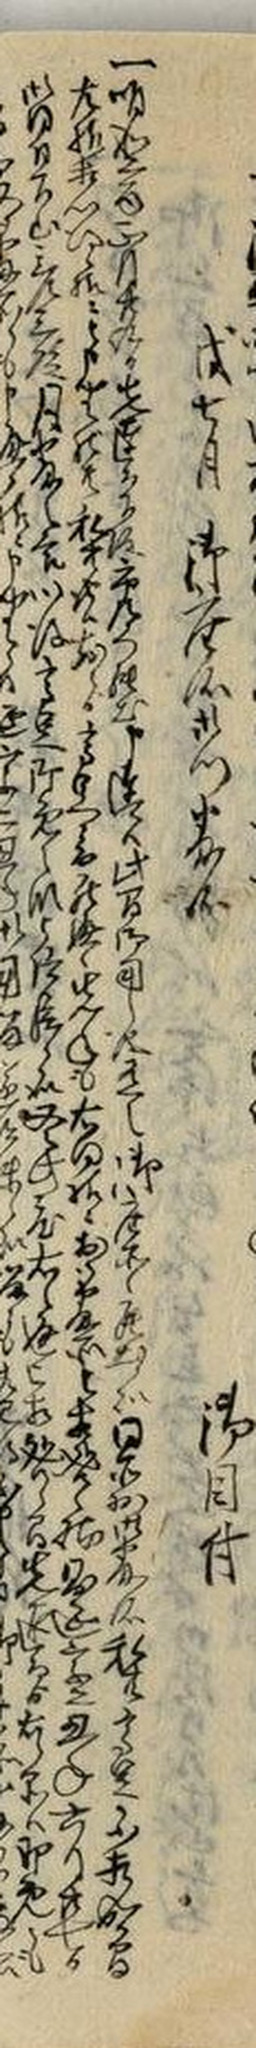一明和二酉正月廿九日先達而下坂市左衛門罷出申達候は此間御用之儀有之御座所へ罷出候処同所於御番所私共高足不相成候間
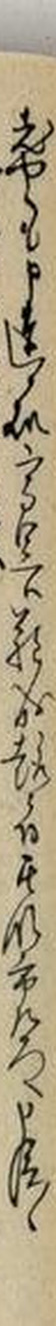老中へも申達候処高足は難成趣に付其段市左衛門へ申渡候
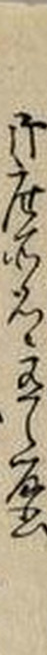御座所御門に有之留書
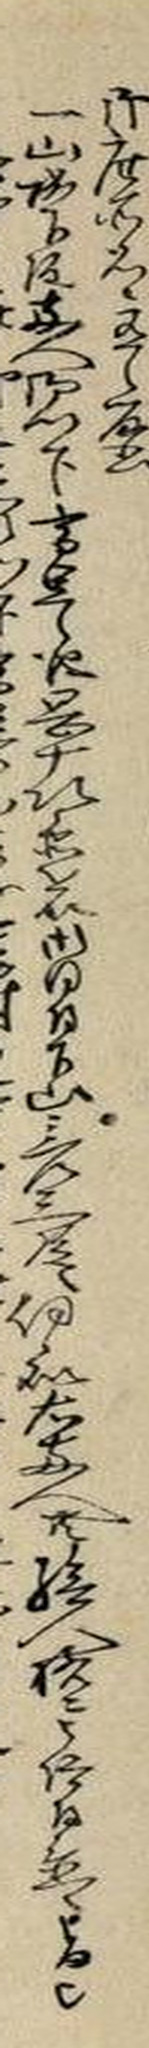一山城下坂両人御門下高足之儀岡十次兵衛を以御目付下山彦三殿へ伺候処右両人共給人格に被仰付置候旨被
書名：御門御櫓之部
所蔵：福井県文書館 Fukui Prefectural Archives
